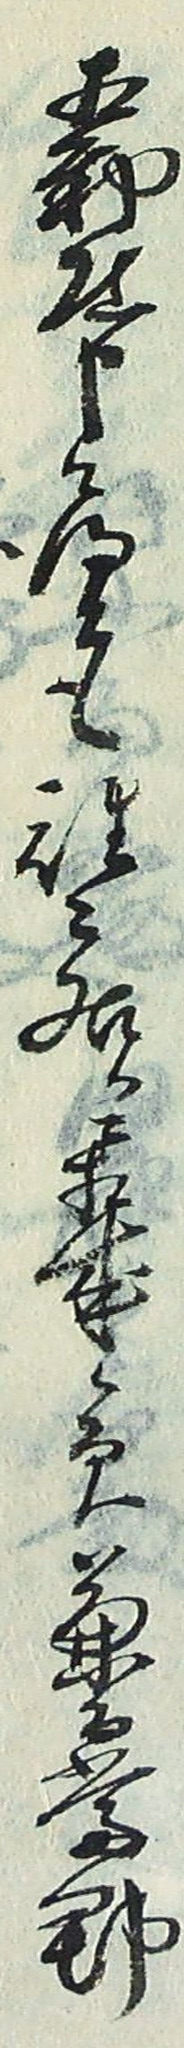相勤居申候得とも往々居りニ相成候而ハ兼而當郡
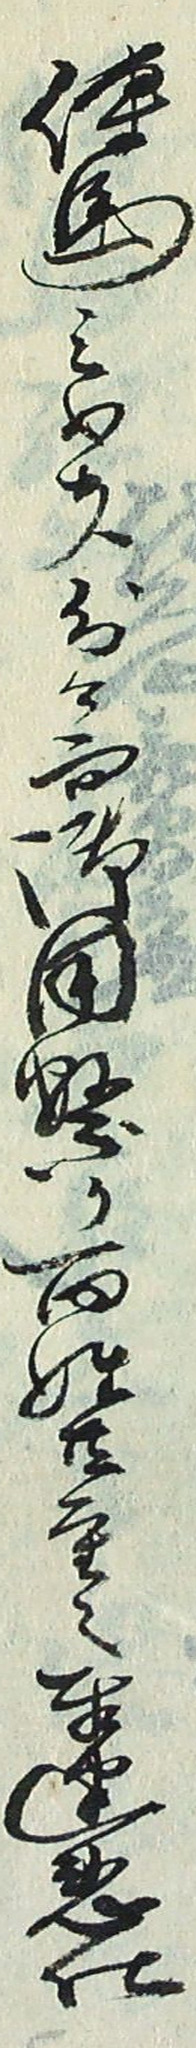傳馬之義者分け而御用繁り百姓共重々奉迷惑仕
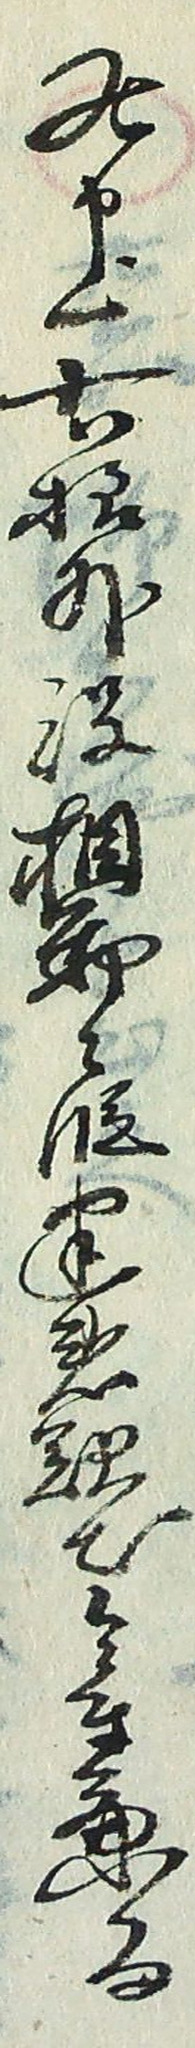居申上右様外役相勤候段迷惑歎出候ニ付兼而
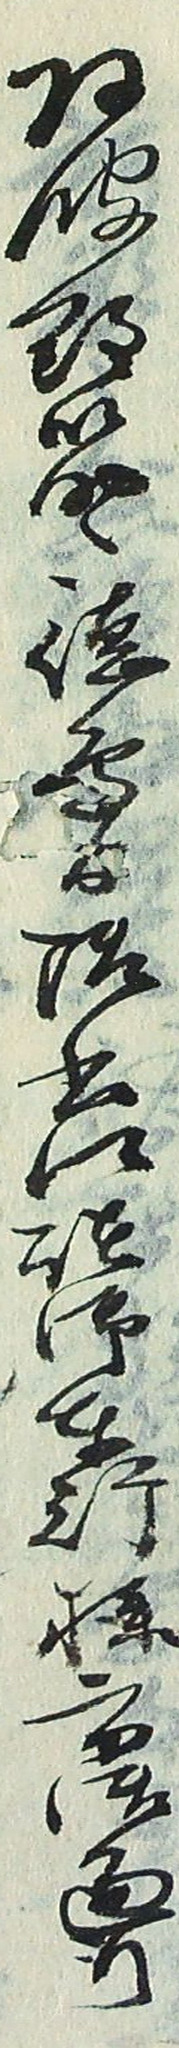阿波郡筋へ徳島ゟ御出郷諸御奉行様方御通行
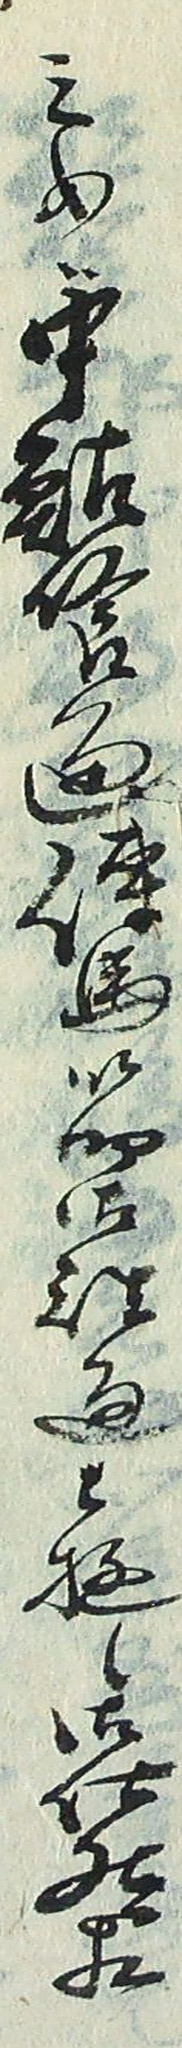之義ハ中鮎喰通傳馬筋御往通被遊候御仕居ニ相
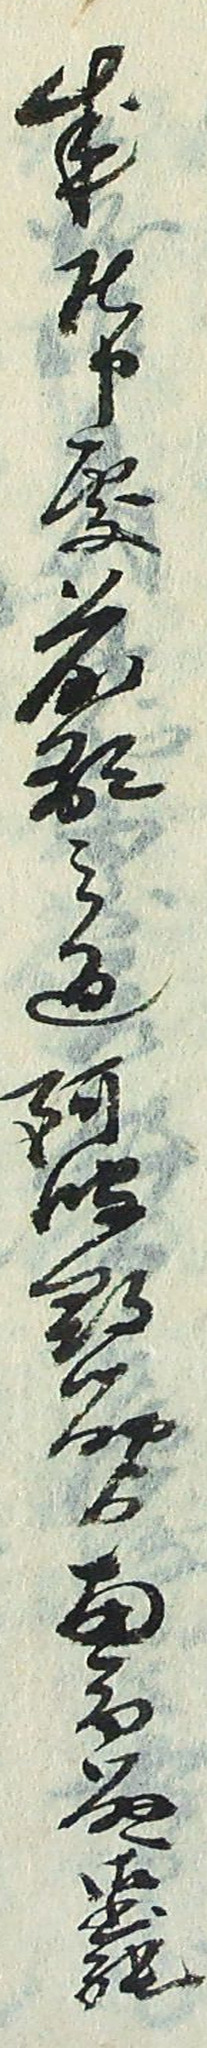成居申處前顕之通阿波郡筋ゟ南方筋へ御出張
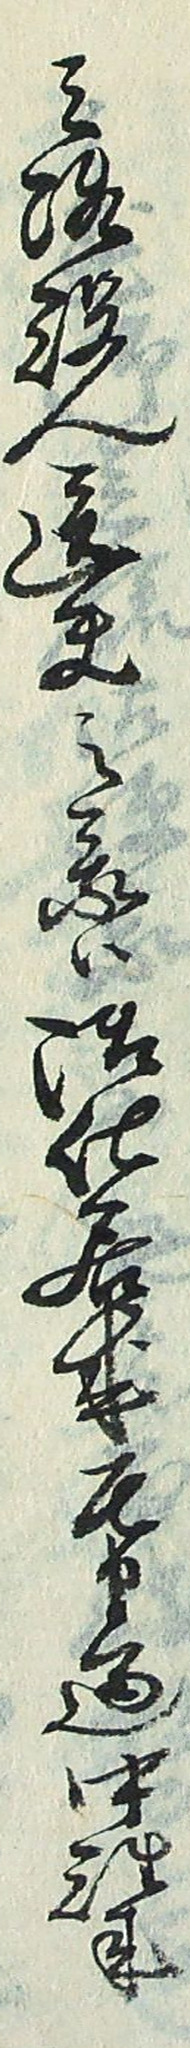之御役人送夫之義ハ御仕居成申通中往来
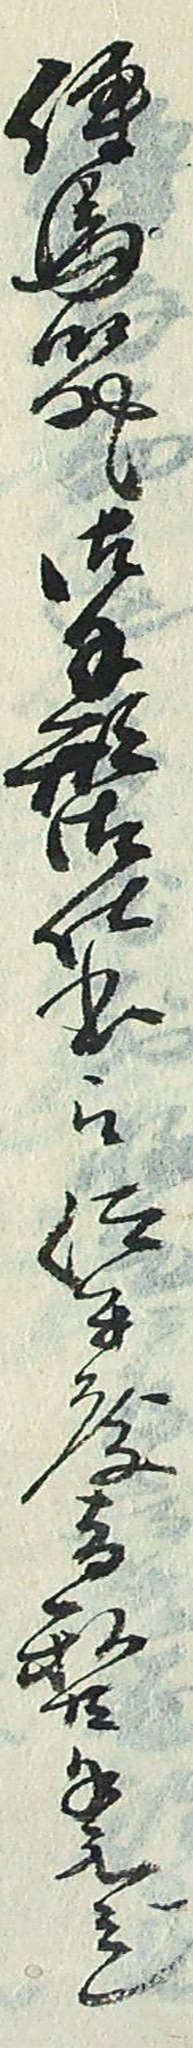傳馬筋之御手形御仕出被仰付度旨私共手元迄
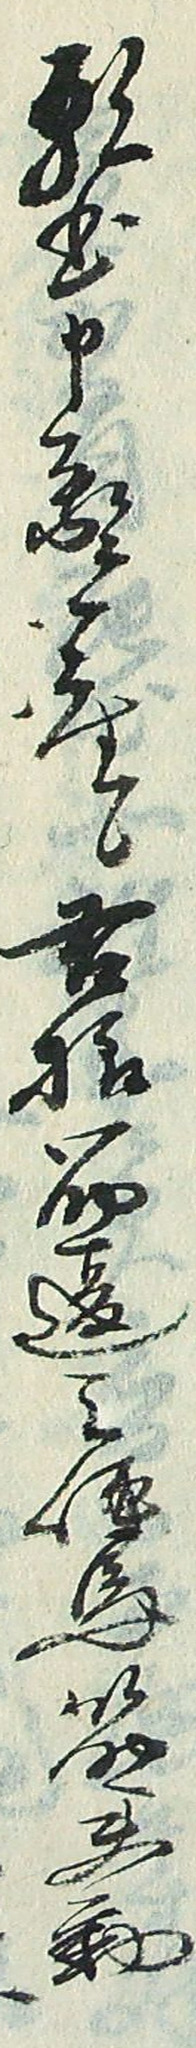願出申義ニ御座候右様筋違之傳馬筋夫勤
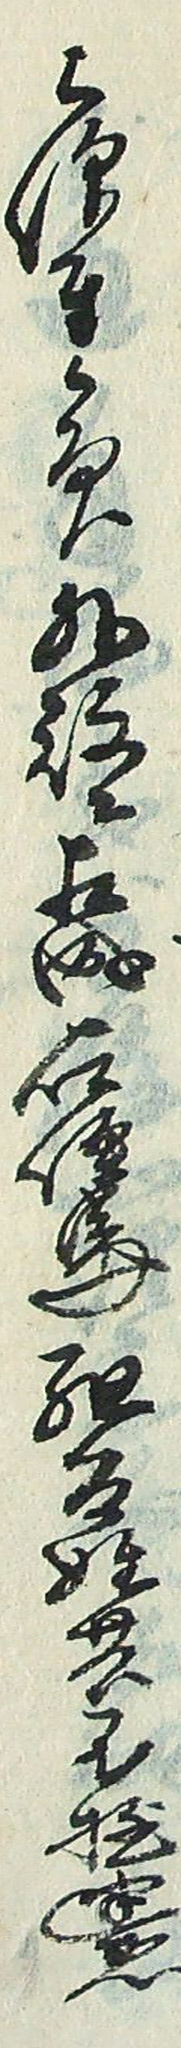被仰付候而ハ外役ニ相成右傳馬組百姓共至極迷惑

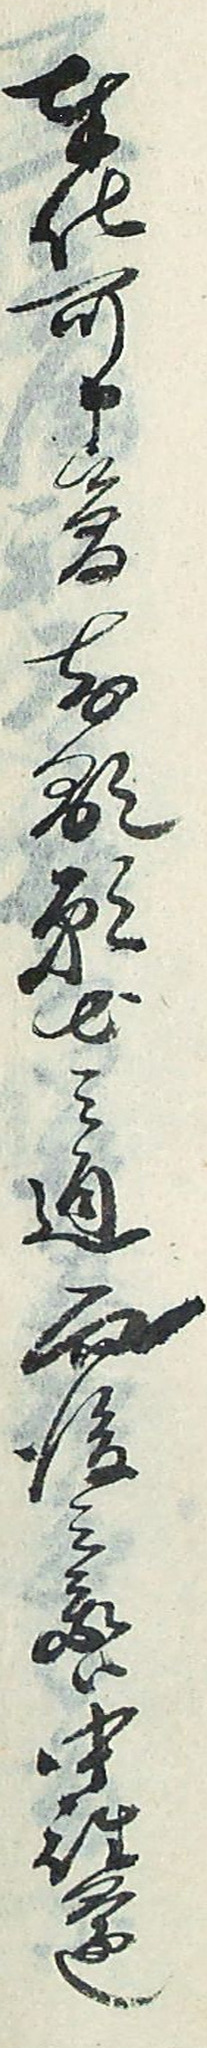奉仕可申候間前顕願出之通向後之義ハ中往還
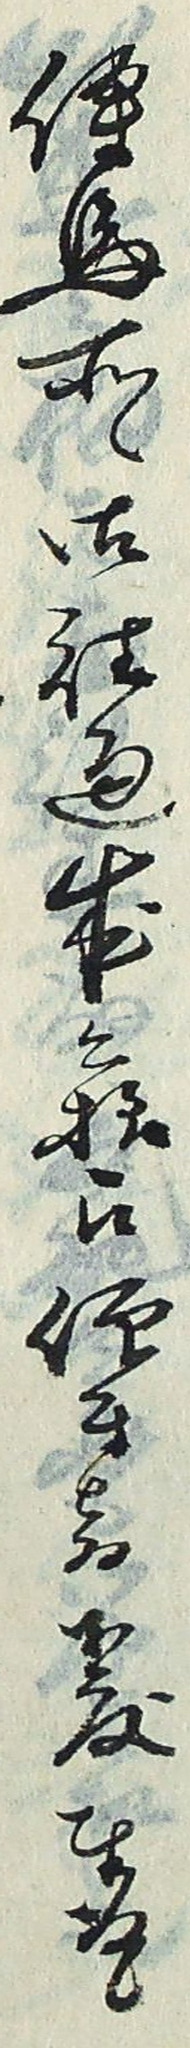傳馬所へ御往通成候様被仰付被為下度奉存候
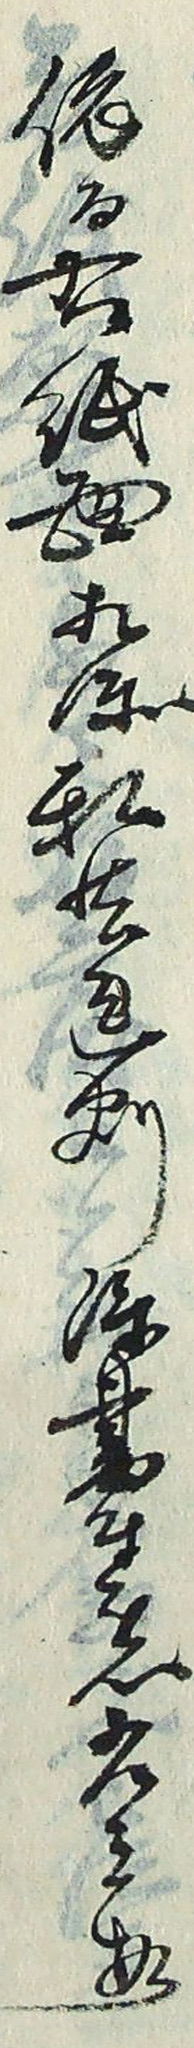依而右紙面相添私共連判添書付を以右之段
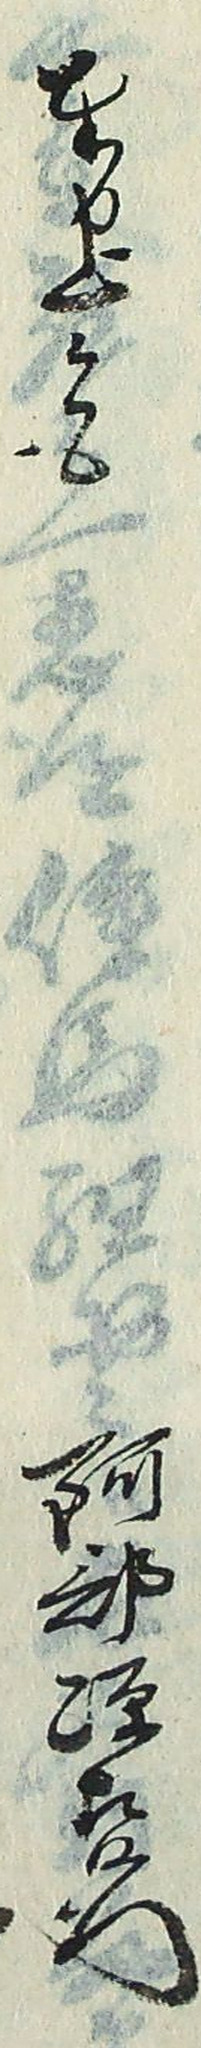奉申上候以上阿部源左衛門
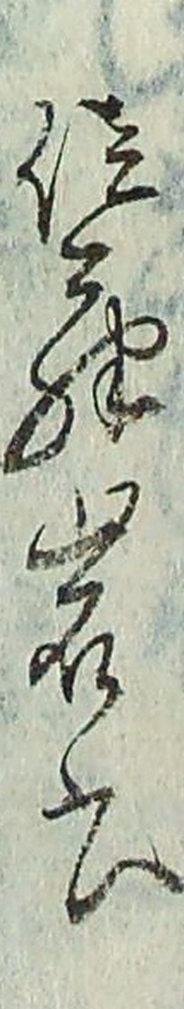佐藤岩六
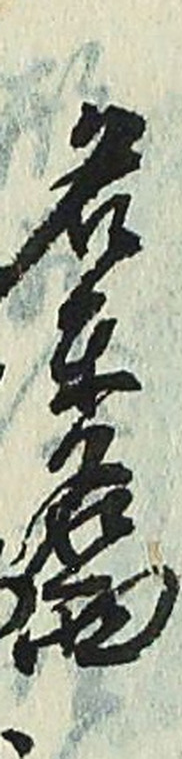名東名西
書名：諸御趣意書并御下知向之写
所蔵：鳴門教育大学 Naruto University of Education
